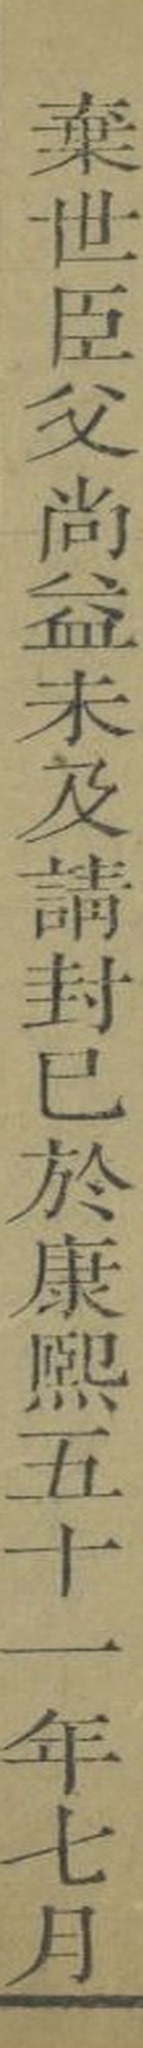棄世臣父尚益未及請封巳於康煕五十一年七月
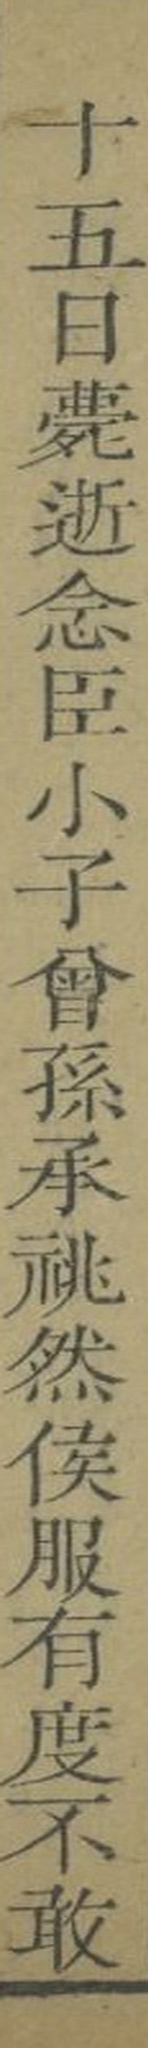十五日薨逝念臣小子曽孫承祧然侯服有度不敢
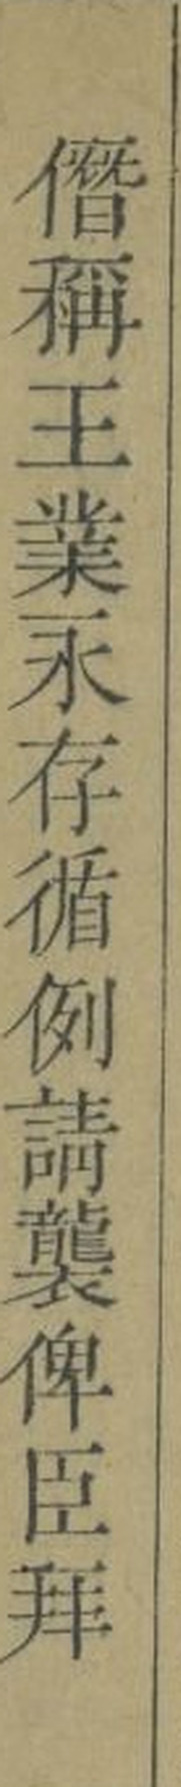僭称王業永存循例請襲俾臣拝
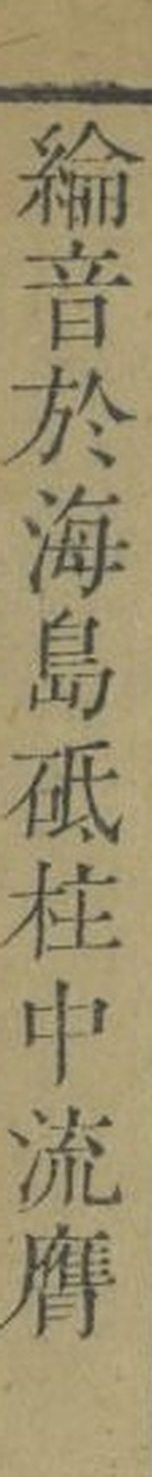綸音於海島砥柱中流膺
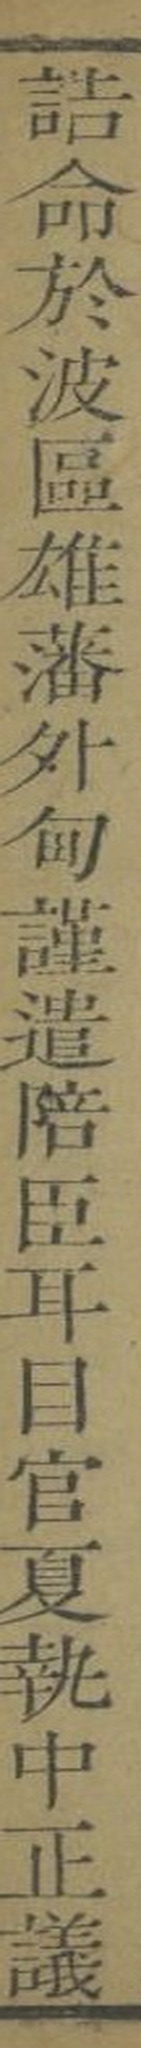誥命於波区雄藩外甸謹遣陪臣耳目官夏執中正議

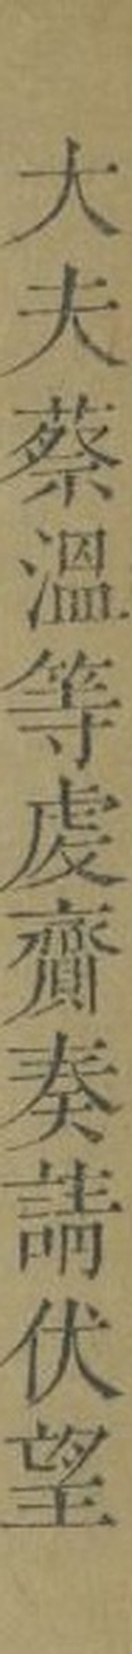大夫蔡温等虔齎奏請伏望
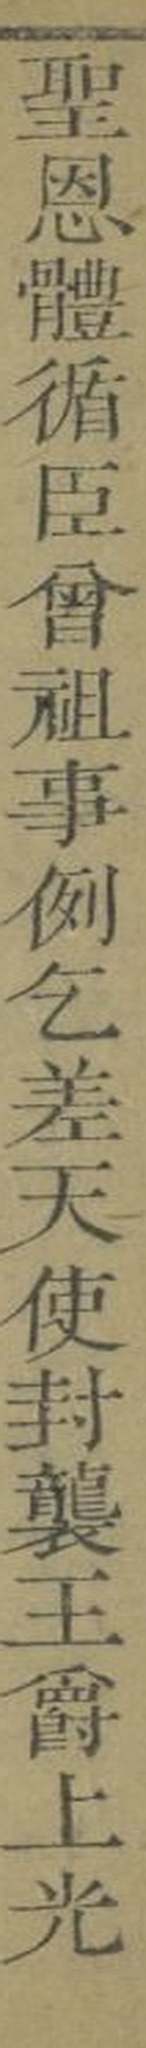聖恩体循臣曽祖事例乞差天使封襲王爵上光
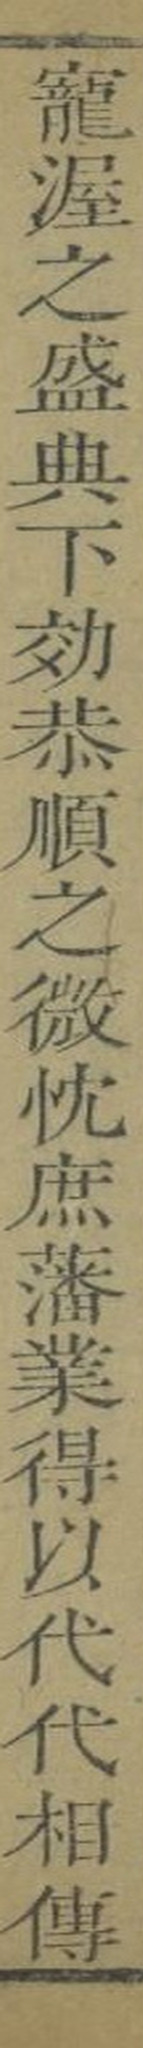寵渥之盛典下効恭順之微忱庶藩業得以代代相伝
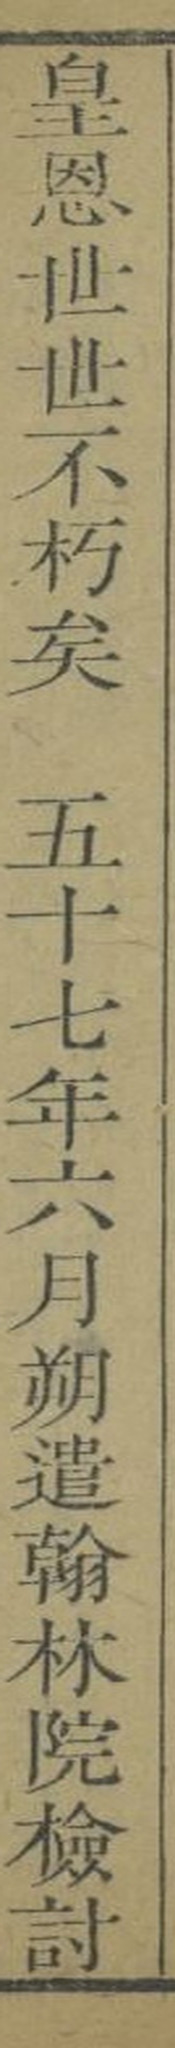皇恩世世不朽矣五十七年六月朔遣翰林院検討
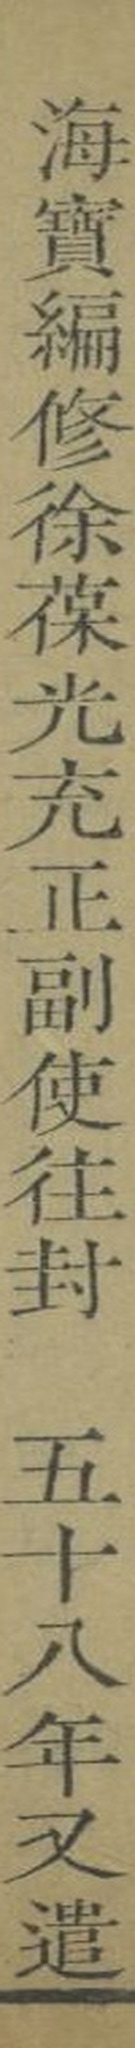海宝編修徐葆光充正副使往封五十八年又遣
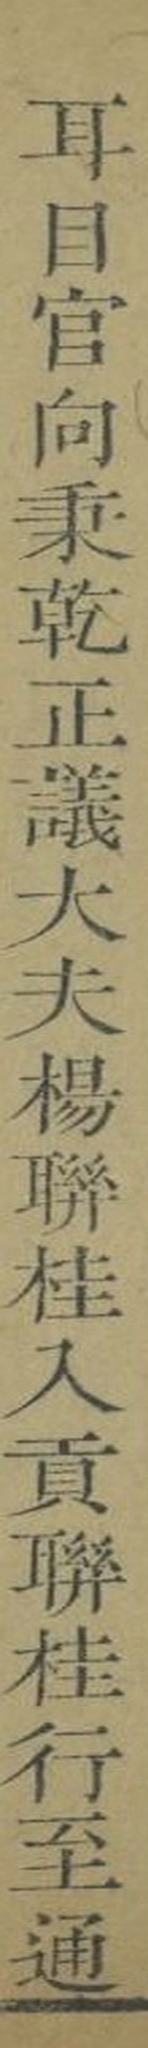耳目官向秉乾正議大夫楊聯桂入貢聯桂行至通
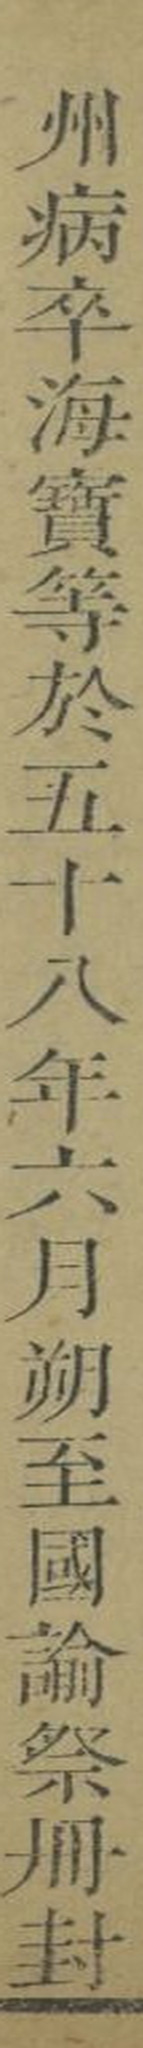州病卒海宝等於五十八年六月朔至国諭祭冊封
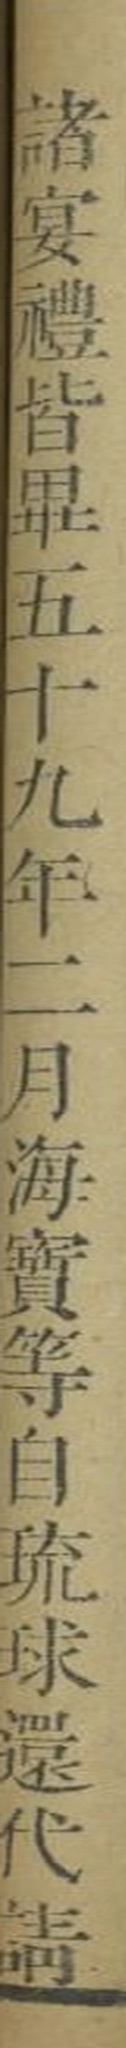諸宴礼皆畢五十九年二月海宝等自琉球還代請
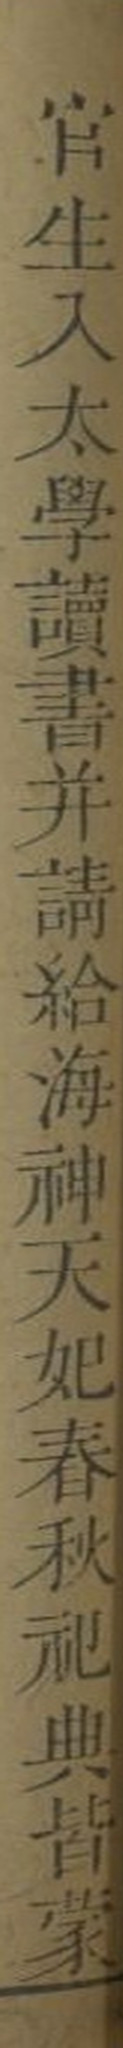官生入太学読書并請給海神天妃春秋祀典皆蒙
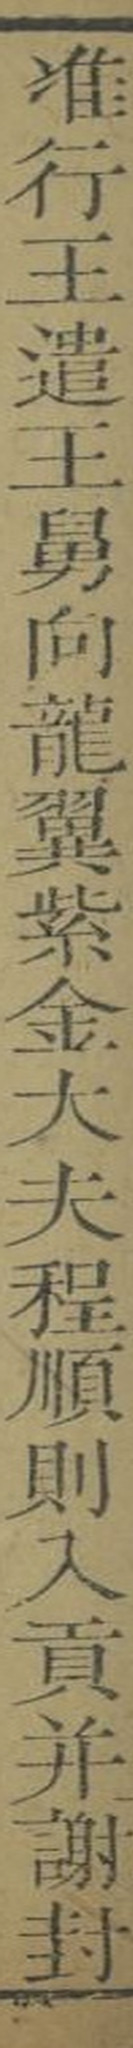准行王遣王舅向竜翼紫金大夫程順則入貢并謝封
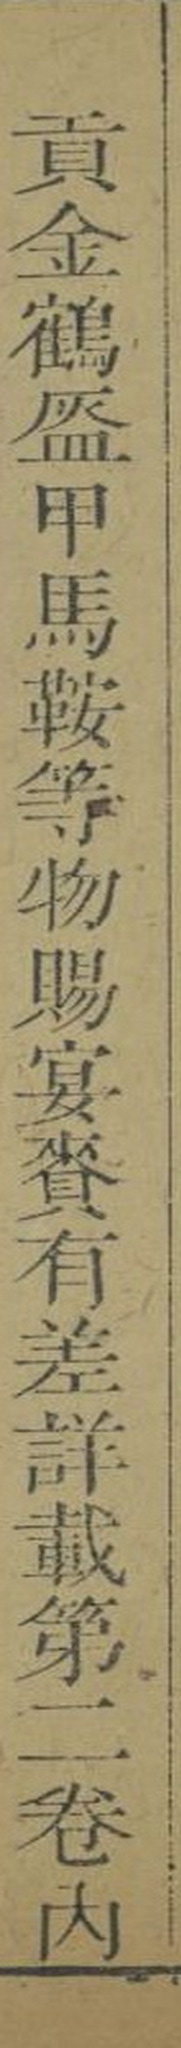貢金鶴盔甲馬鞍等物賜宴賚有差詳載第二巻内
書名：中山伝信録 巻四
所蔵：University of the Ryukyus Library
